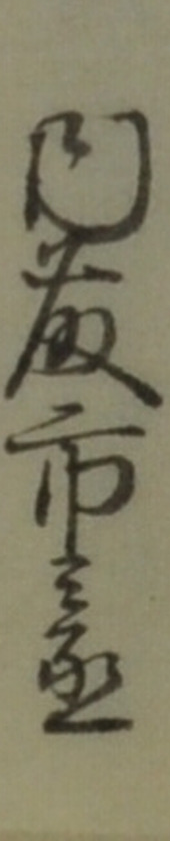内藤市之丞
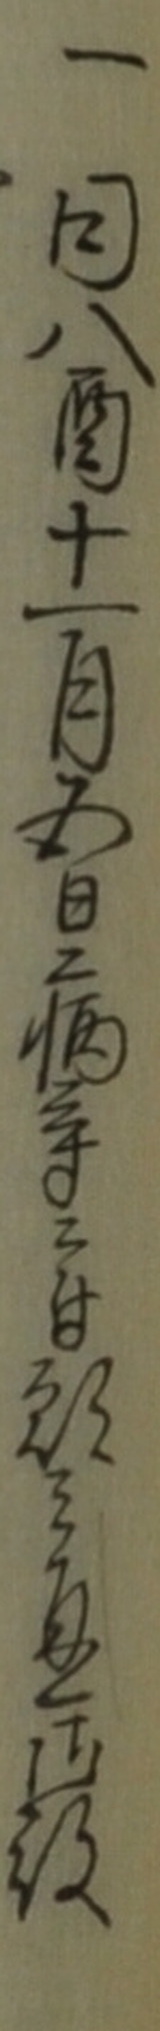一同八酉十一月五日病気ニ付願之通御役
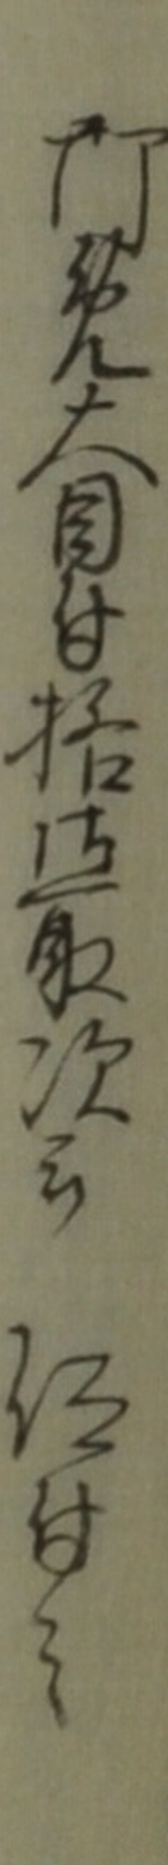御免大目付格御取次被仰付之
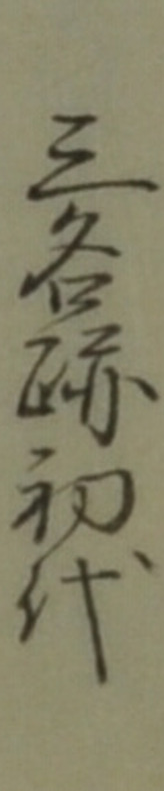三名跡初代
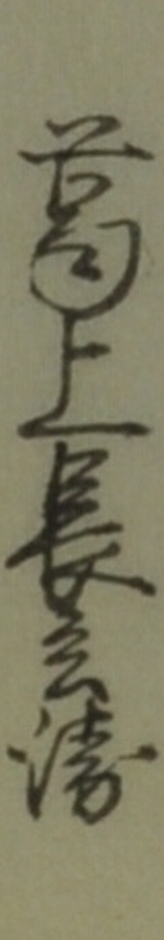葛上長兵衛
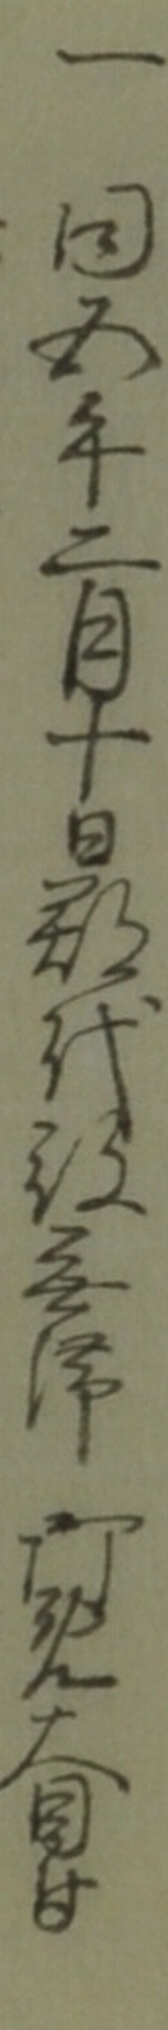一同五午二月十日郡代役無滞御免大目付
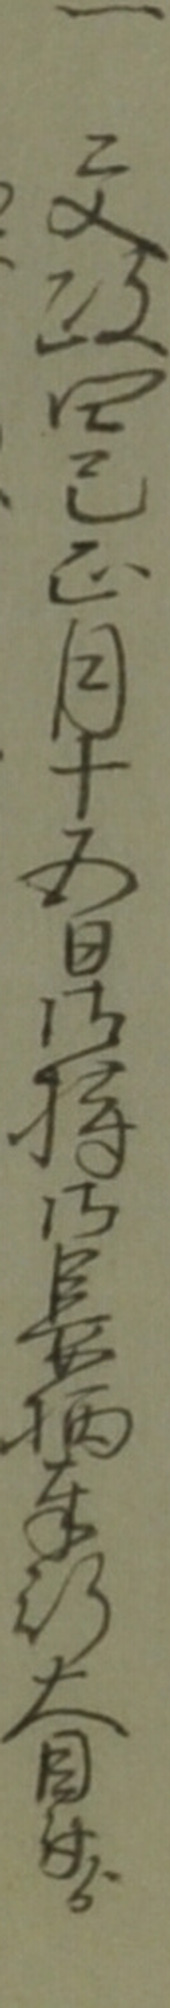一文政四巳正月十五日御持御長柄奉行大目付ゟ
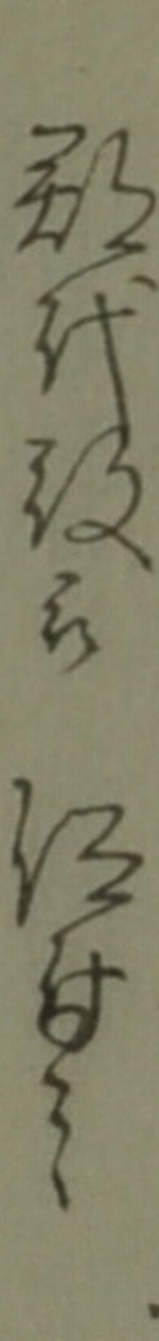郡代役被仰付之
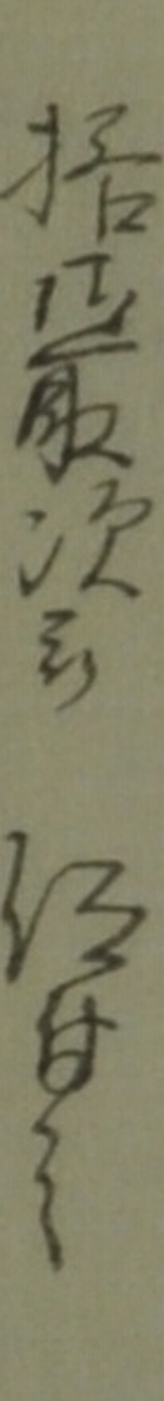格御取次被仰付之
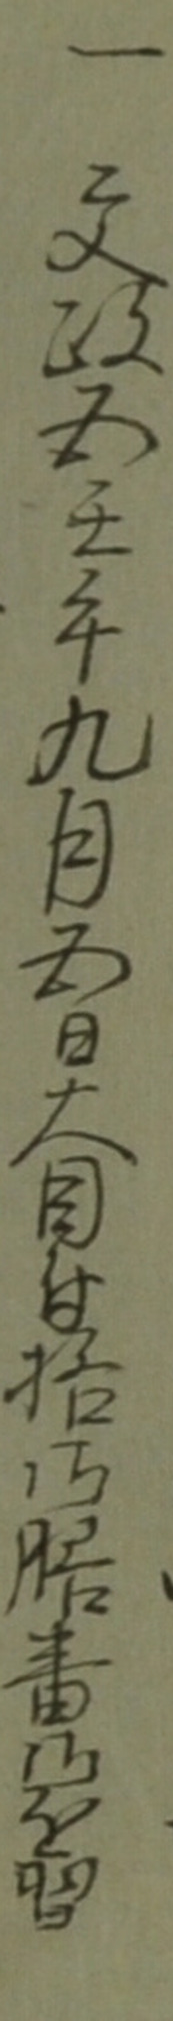一文政五壬午九月五日大目付格御膳番御近習
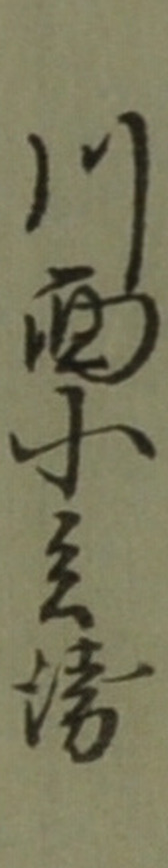川西小兵衛
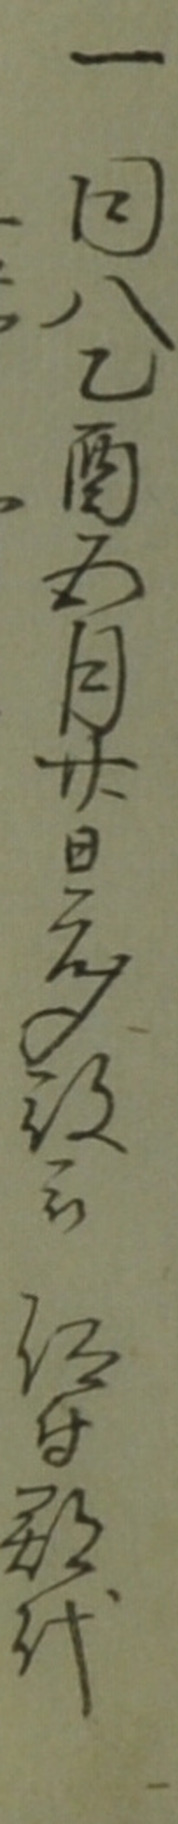一同八乙酉五月廿日元〆役被仰付郡代
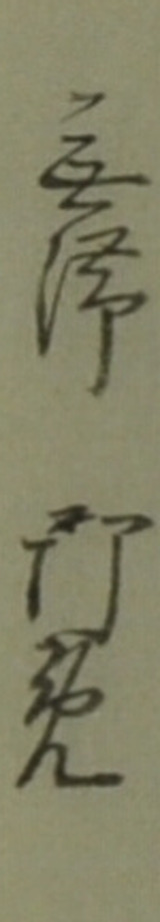無滞御免

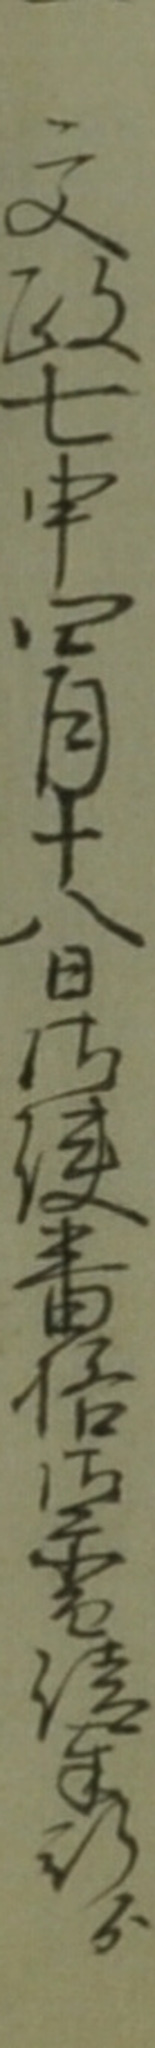一文政七申四月十八日御使番格御普請奉行ゟ
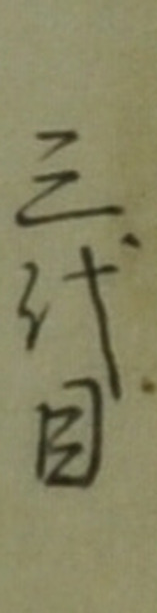三代目
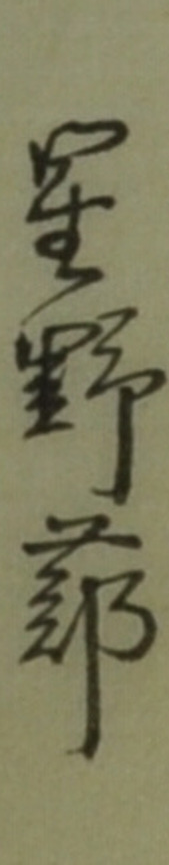星野蔀
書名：諸御役代々録（二）
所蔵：伊那市立高遠町図書館・合同会社AMANE
